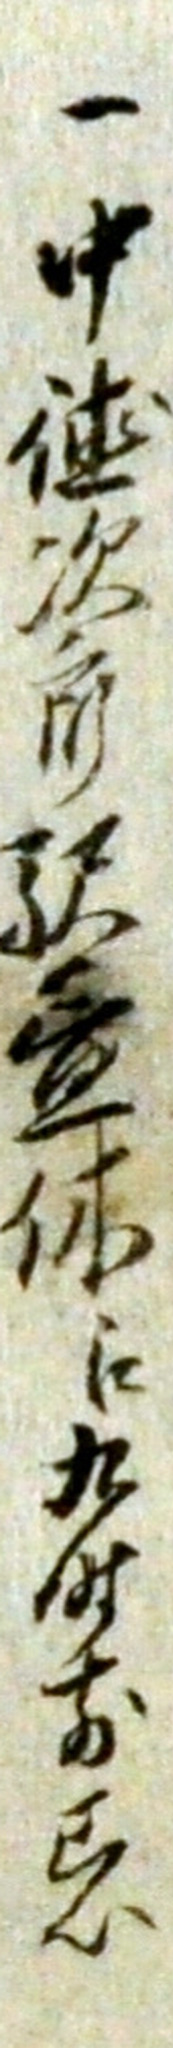一中徳次郎駅昼休江九時前着
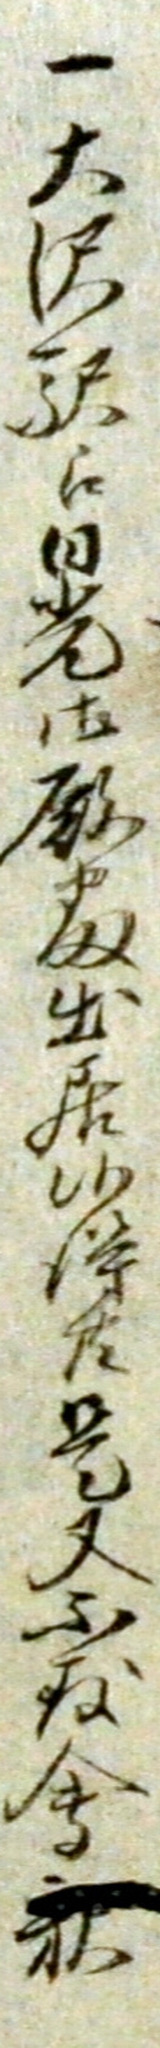一大沢駅江日光御殿番出居候得共是又不致会釈
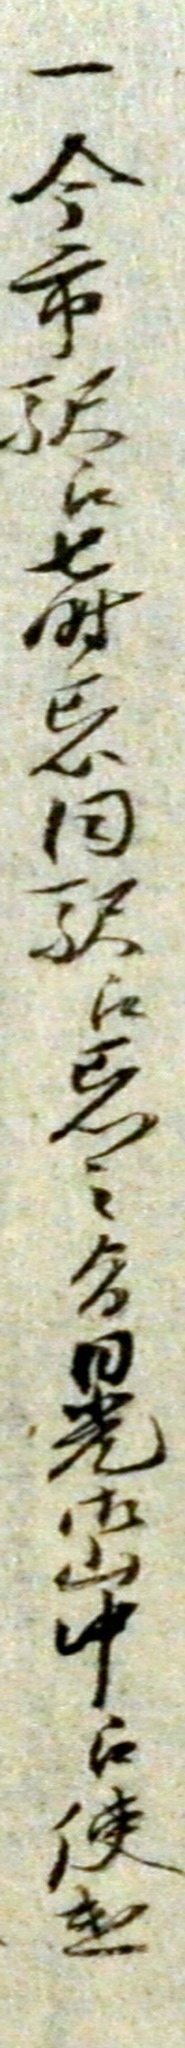一今市駅江七時着同駅江着之旨日光御山中江使遣
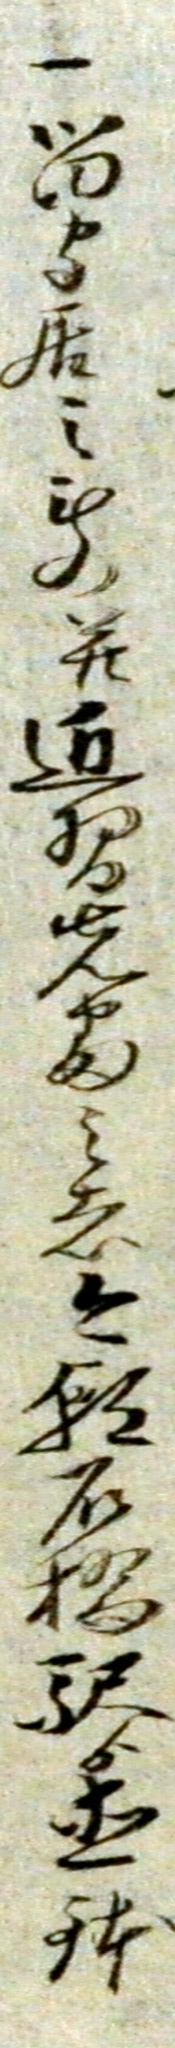一留守居之處幷近習先番之者今朝石動駅ゟ直鉢
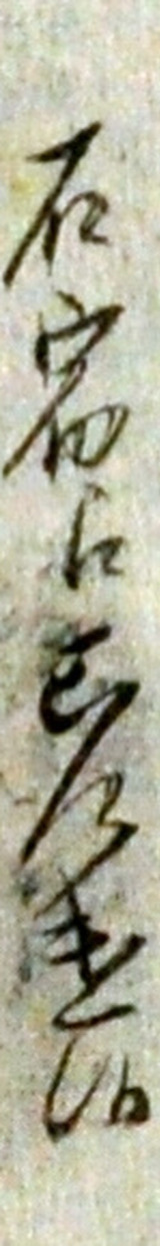石宿江差遣候
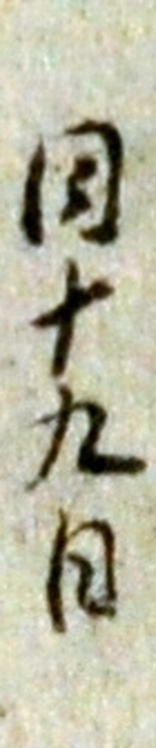同十九日
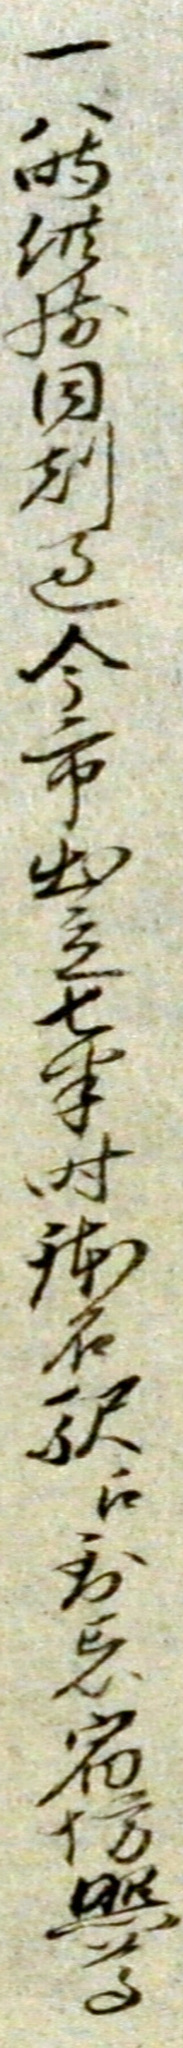一八時供揃同刻過今市出立七半時鉢石駅江到着宿坊照尊
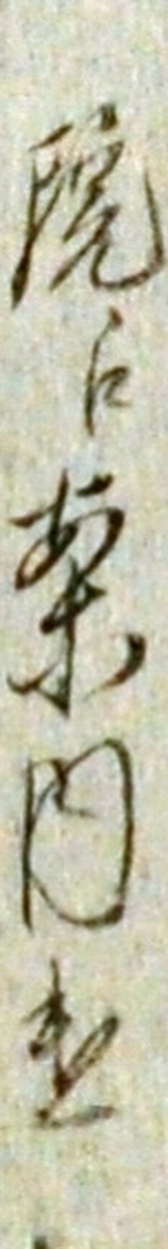院江案内遣
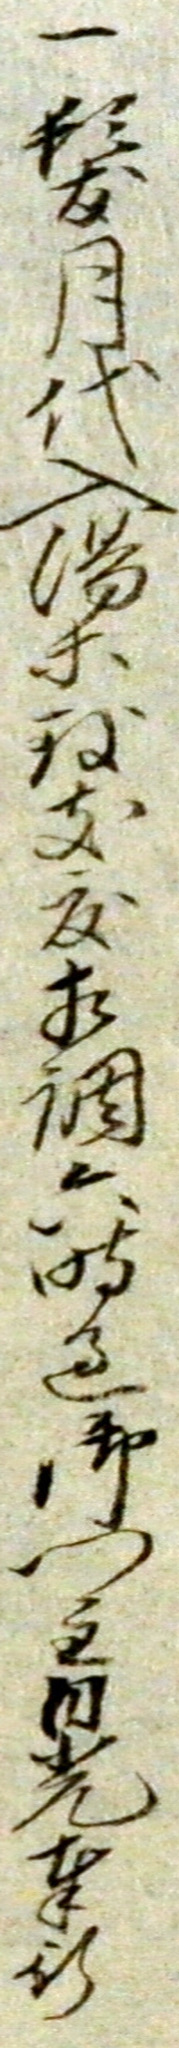一髪月代入湯抔致支度相六時過御門主日光奉行
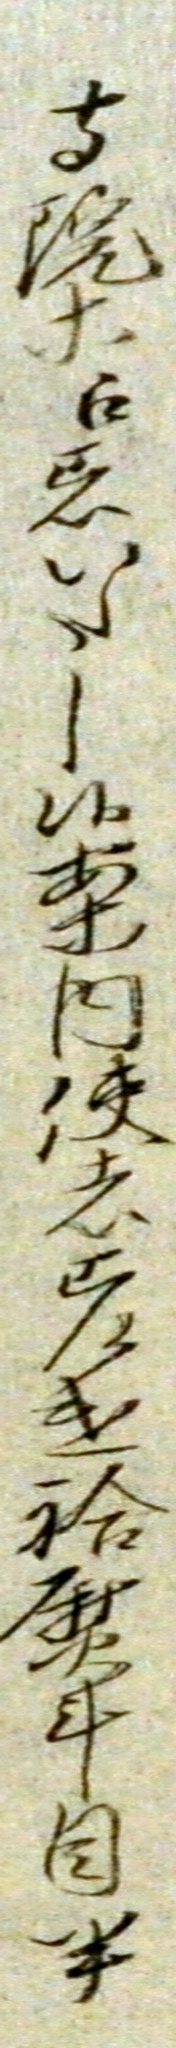寺院抔江着いたし候案内使者差遣袷熨斗目半
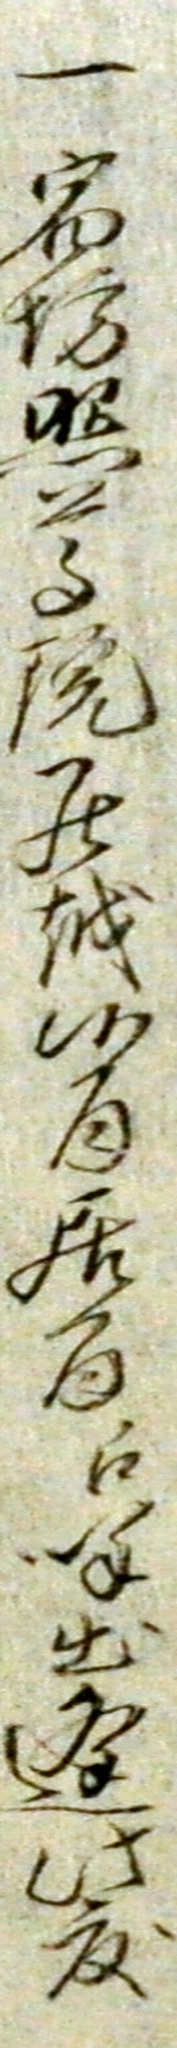一宿坊照尊院罷越候居間江呼出逢此度
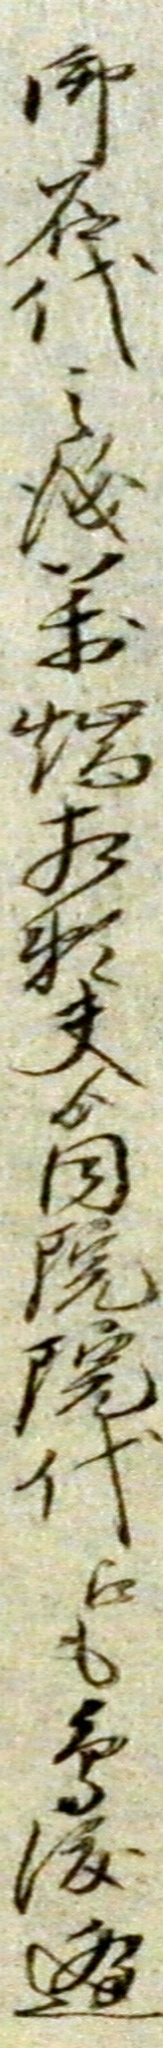御名代之儀萬端相頼夫ゟ同院院代江も鳥渡逢
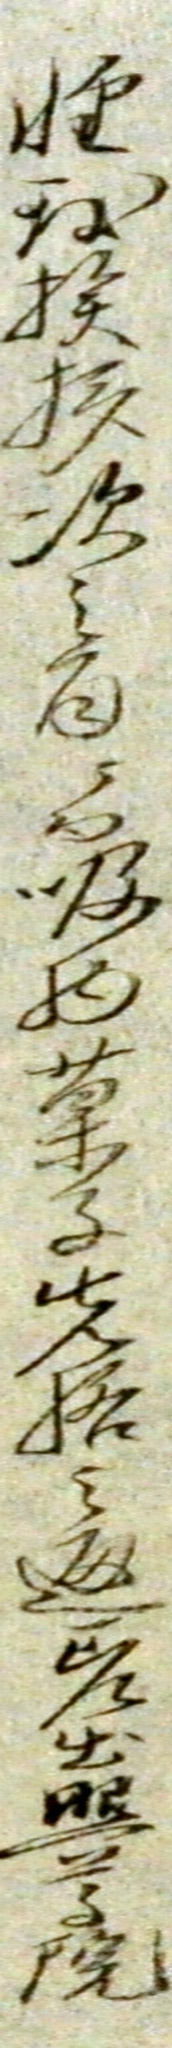軽致挨拶次之ニ而吸間物菓子先格之通差出照尊院
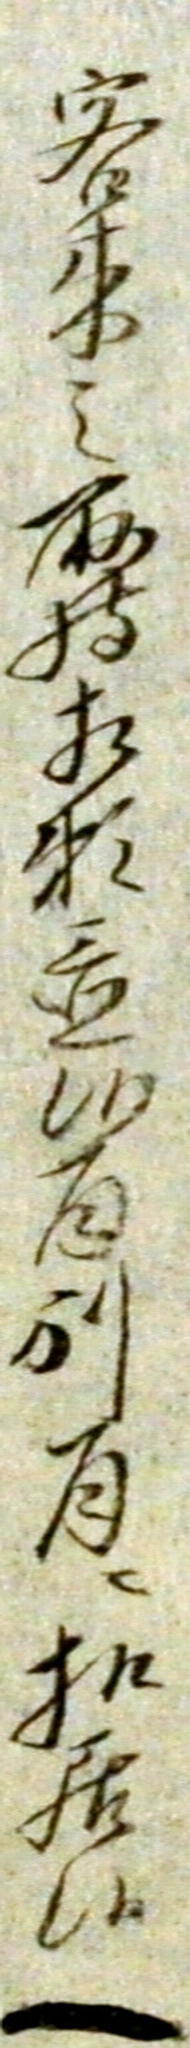客来之取持相頼置別間二扣居候
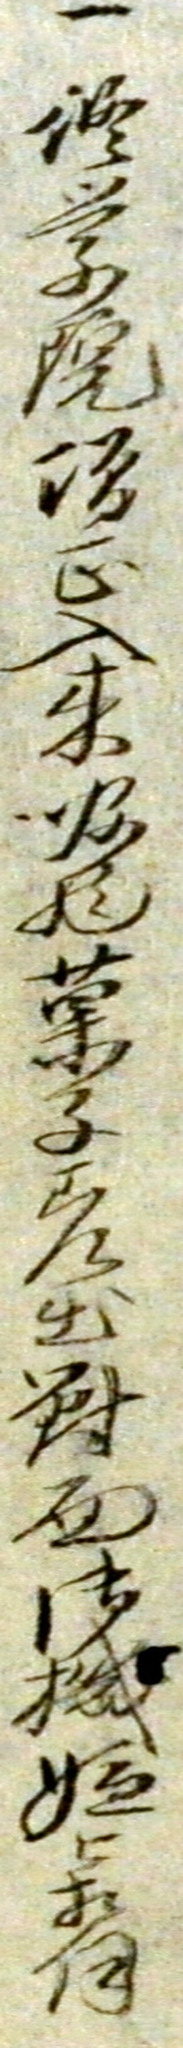一證学院僧正入来吸物菓子差出対面御機嫌ヒ相伺
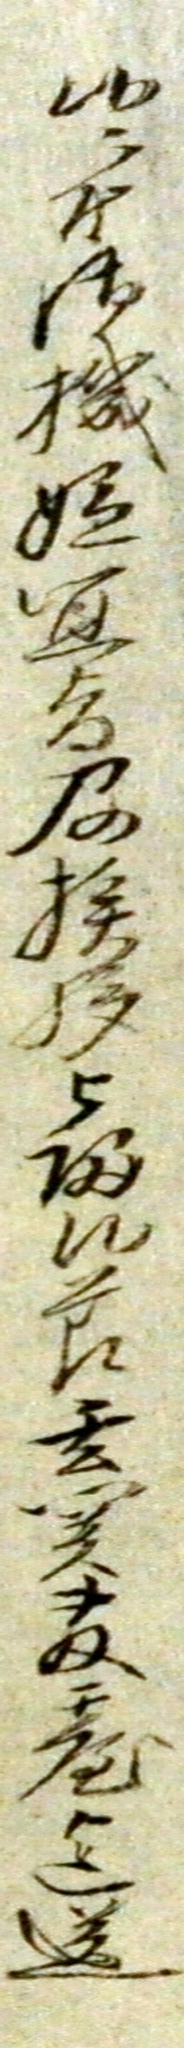候ニ付御機嫌宣旨及挨拶ヒ帰ㇽ節玄関敷臺迄送
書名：日光御名代相勤候節ノ留
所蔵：伊那市立高遠町図書館・合同会社AMANE
